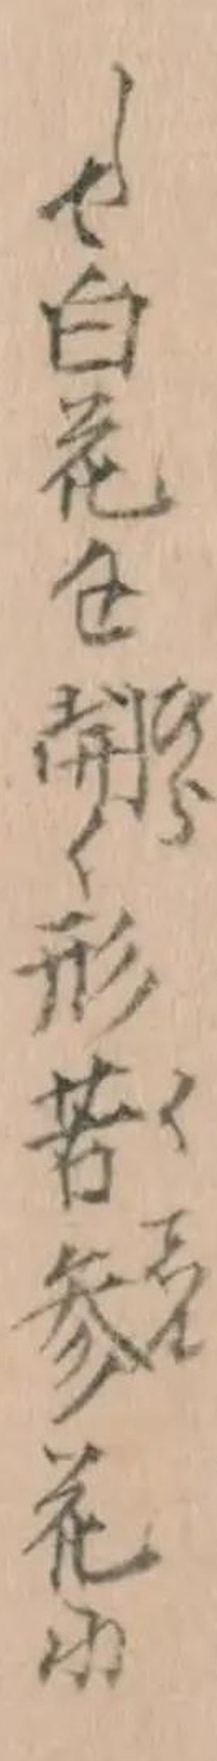して白花を開く形苦参花に
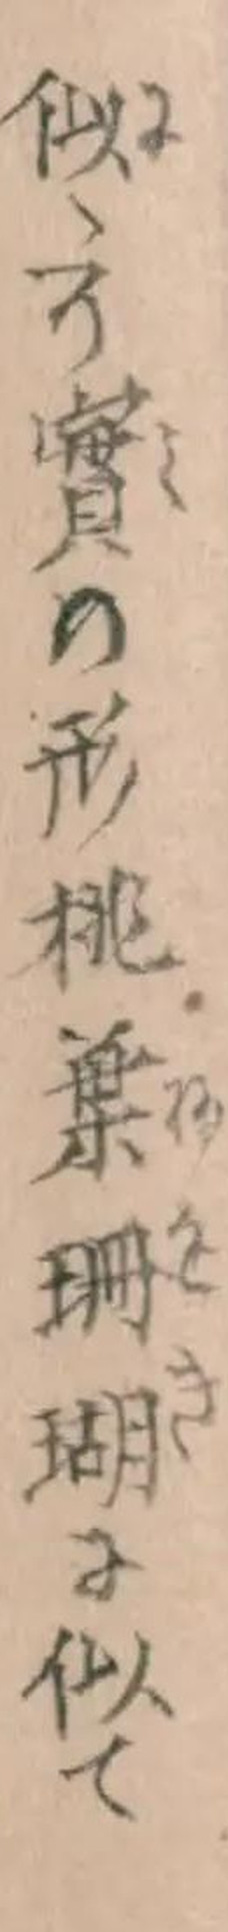似たり実の形桃葉珊瑚に似て
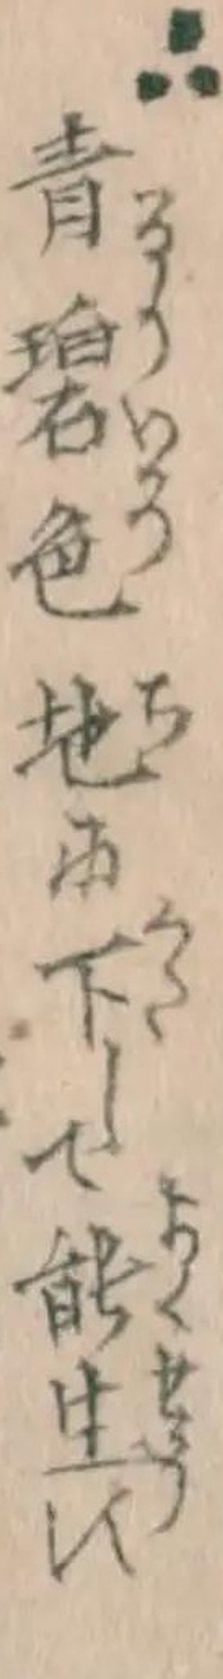青碧色地に下して能生す
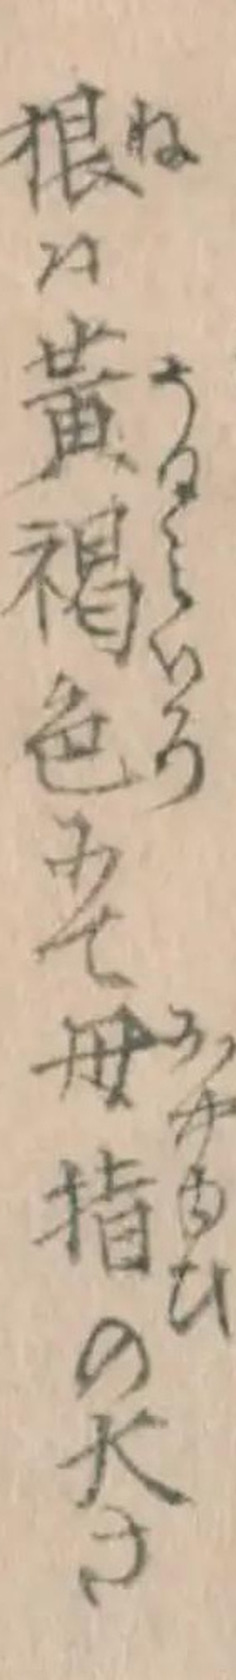根は黄褐色にて母指の大さ
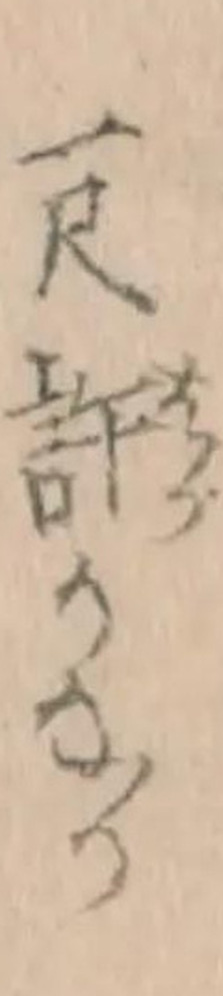一尺許りなり

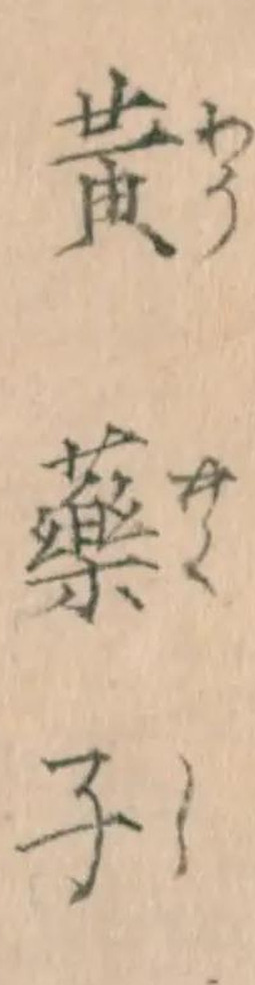黄薬子
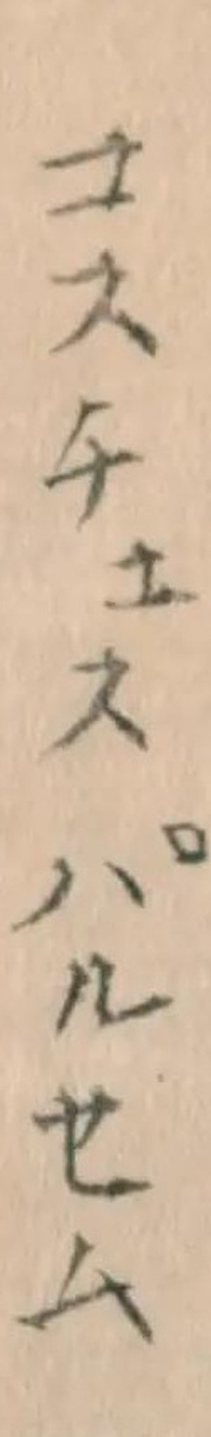コスチュスパルセム
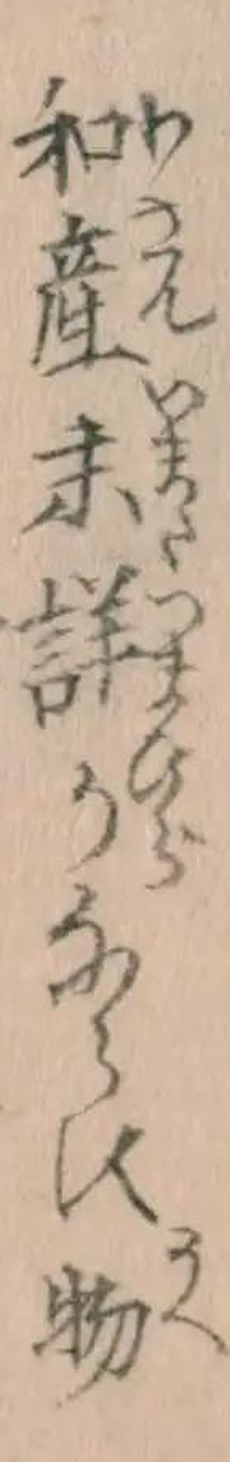和産末詳かならす物
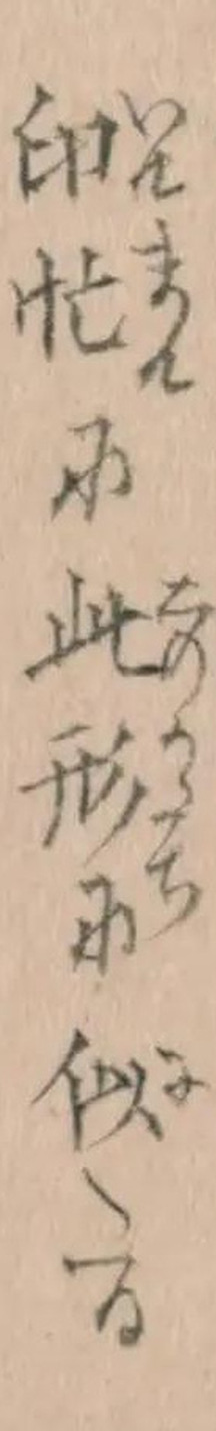印忙に此形に似たる
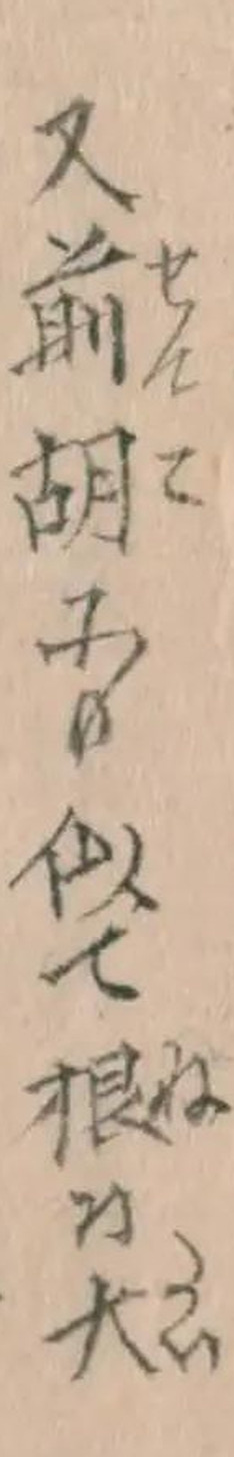又前胡にも似て根は大
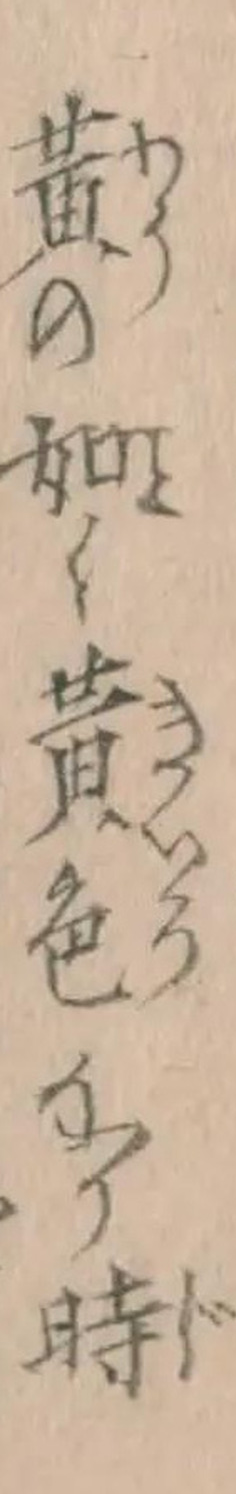黄の如く黄色なり時
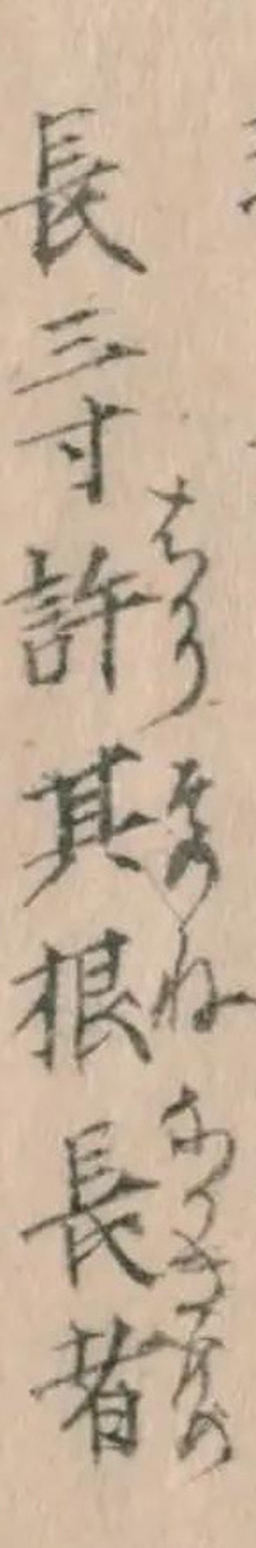長三寸許其根長者
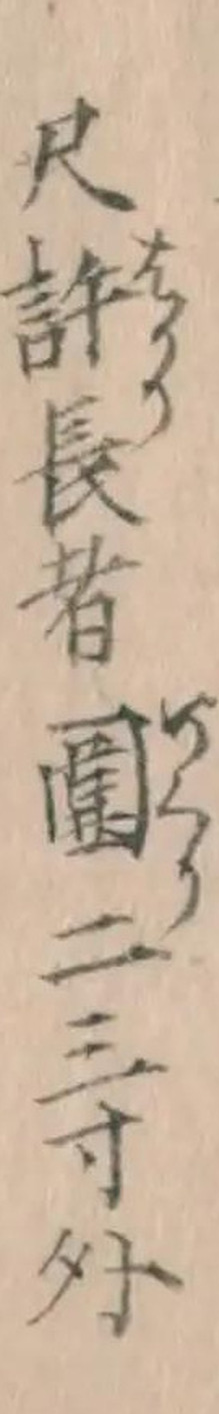尺許長者囲二三寸外
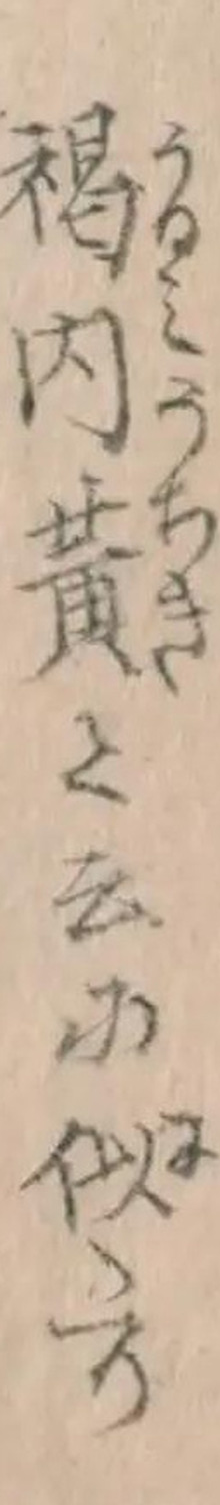褐内黄と云に似たり

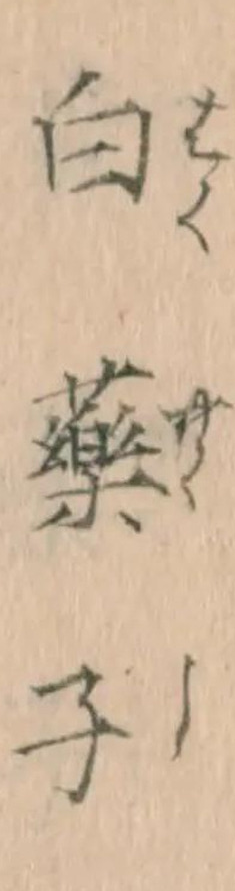白薬子
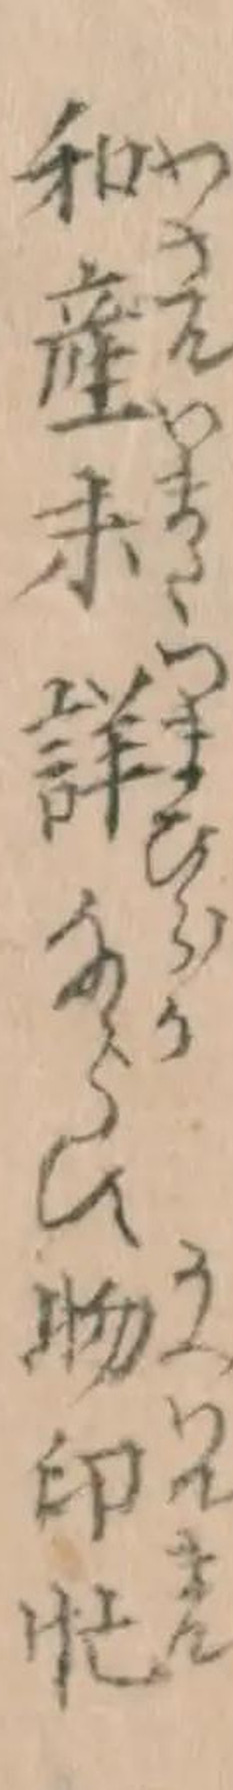和産未詳ならす物印忙
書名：本草図譜. 巻28-30
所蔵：国立国会図書館 National Diet Library, JAPAN
